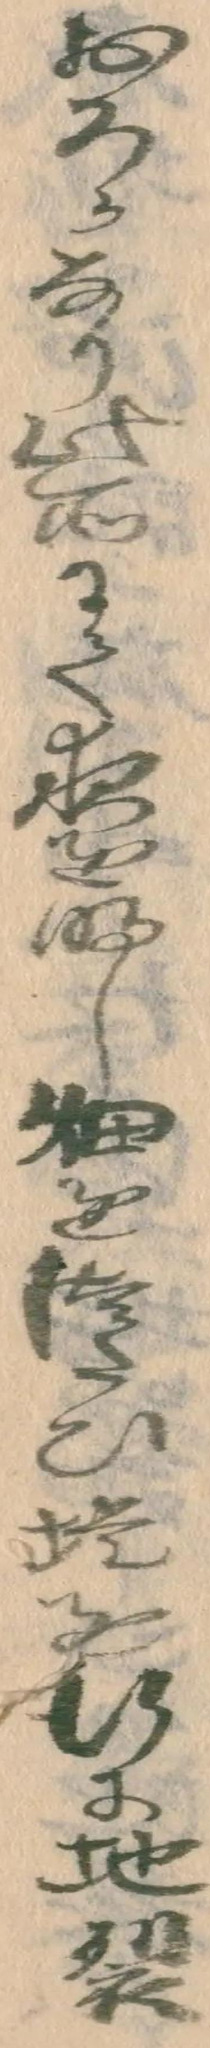おろかなり此所にて夜を明し畑をつたひ堤を行に地さ裂
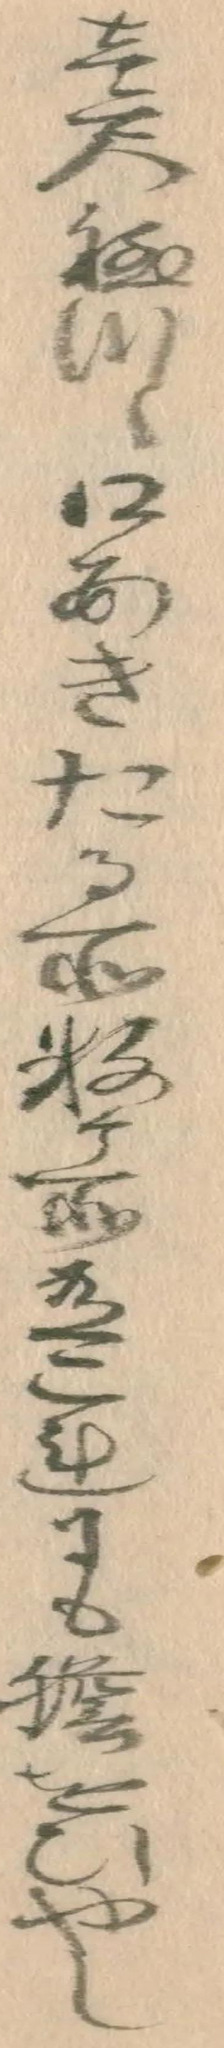壱尺程つゝ口あきたる所数ヶ所有これにも膽をひやし
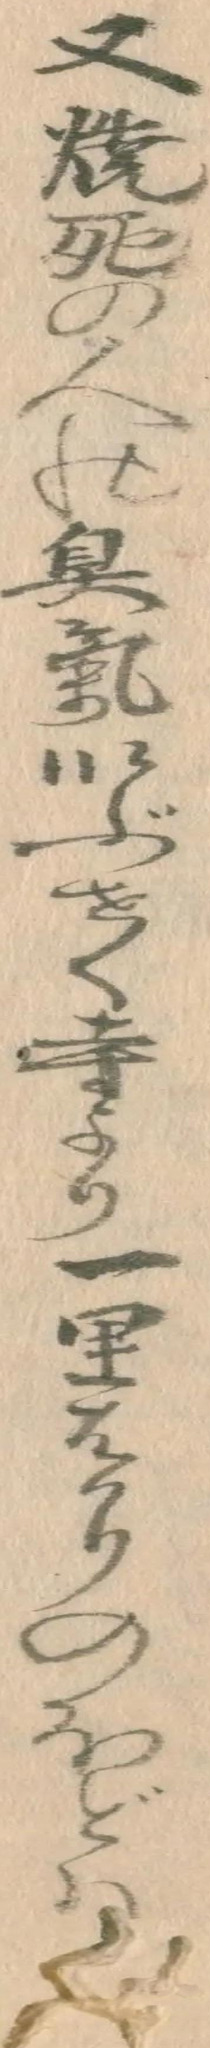又焼死の人の臭気いぶせく寺より一里はかりのほどハ
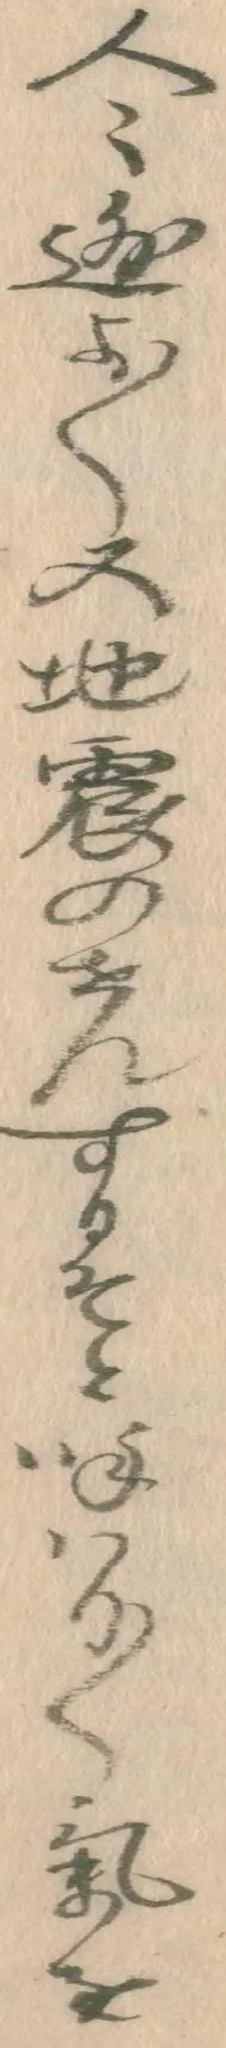人々逃よ〳〵また地震のせんするそと呼ハり〳〵気を
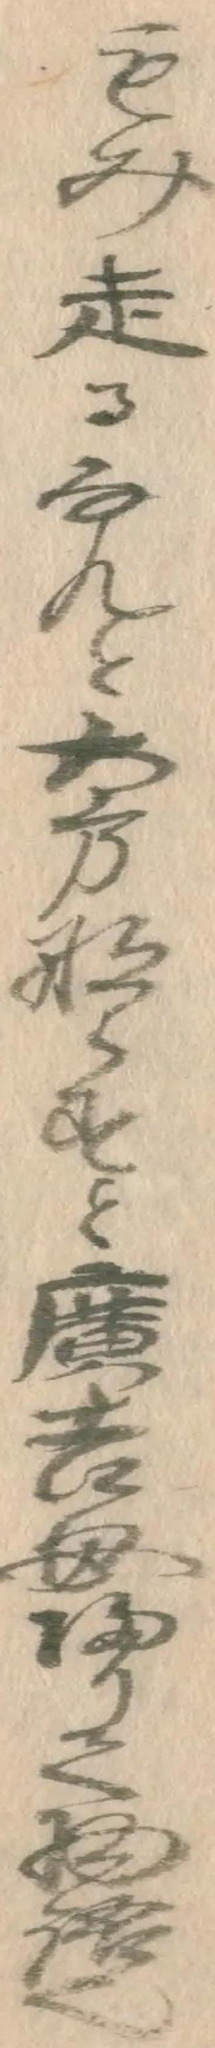もみ走るなんと大方ならすと広吉母帰りて物語也
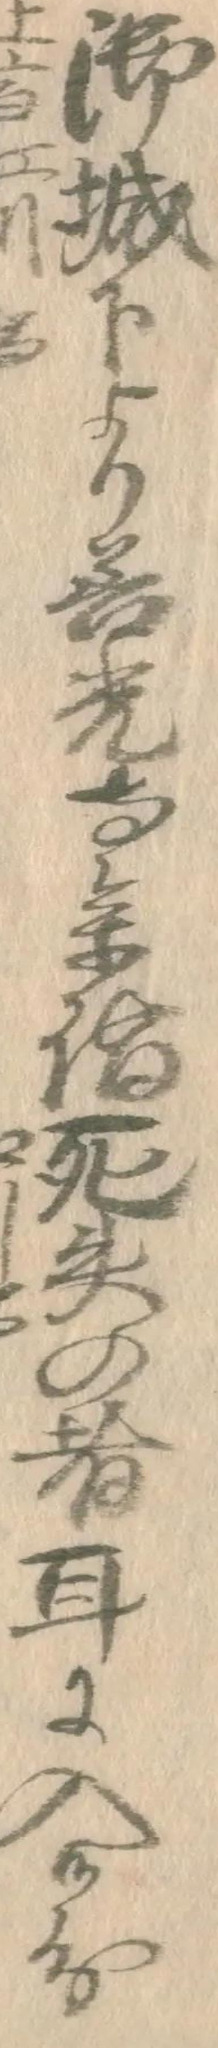御城下より善光寺参詣死失の者耳に入候分
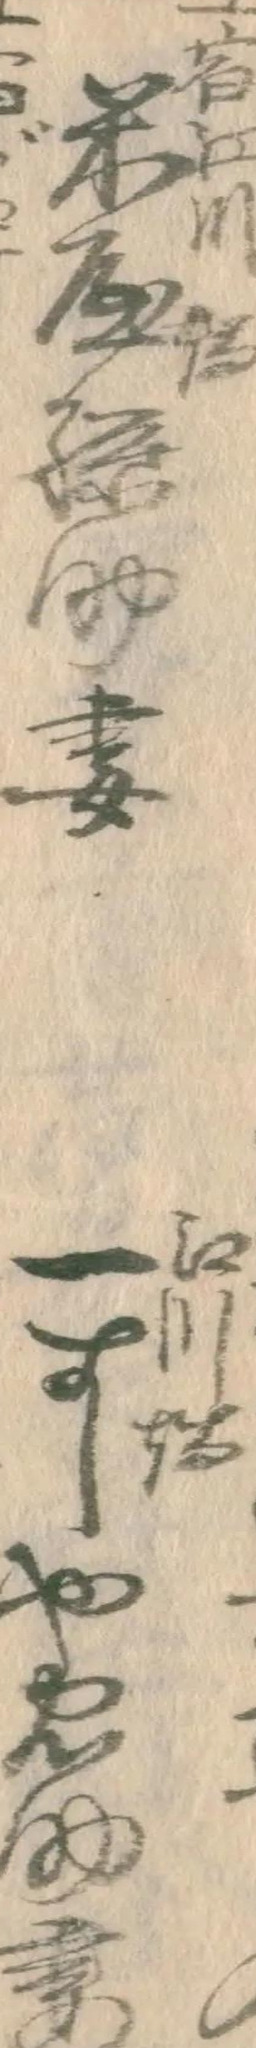一米屋孫助妻一すや忠助妻
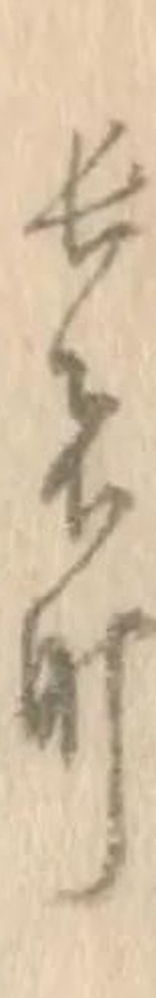長下町

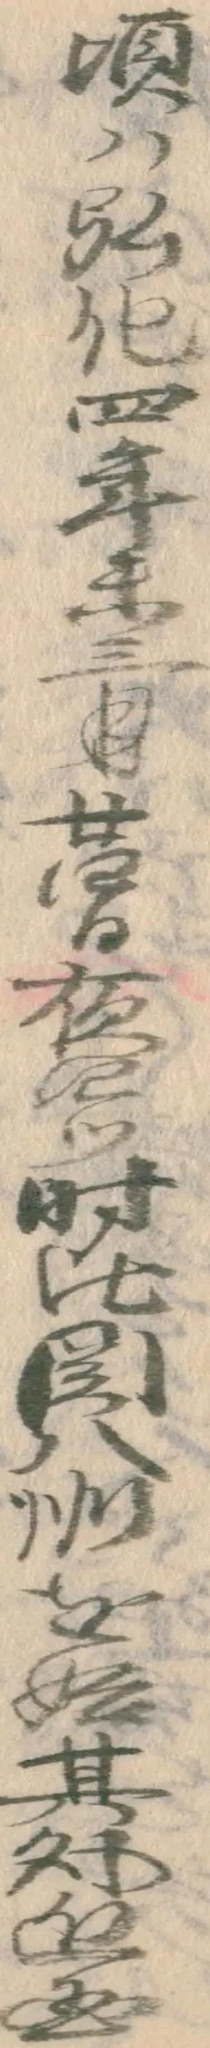頃ハ弘化四年未三月廿四日夜四ッ時比関八州を始其外近国
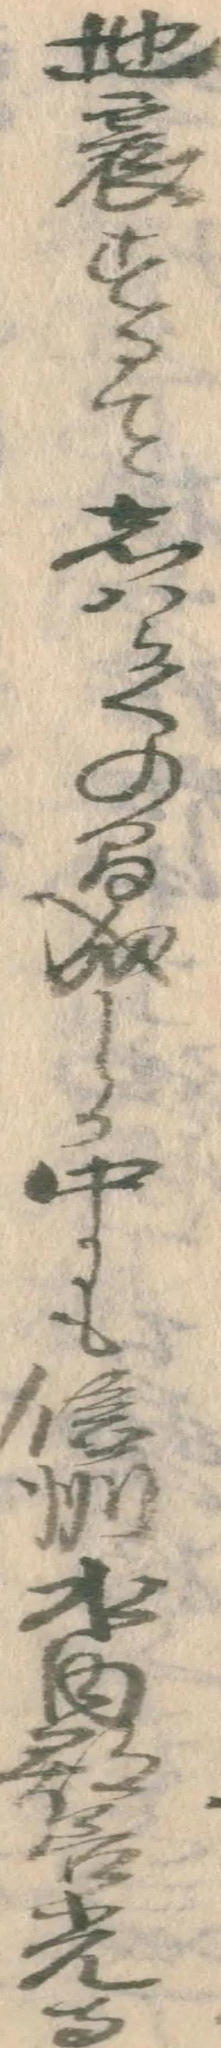地震することしハらくの間成しか中にも信州水内郡善光寺
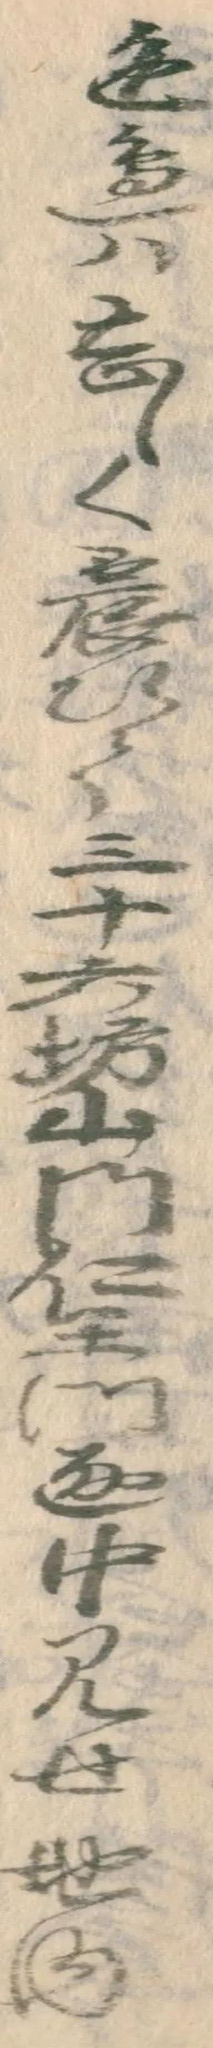近辺ハ甚しく震ひて三十六坊山門仁王門通中見せ地内
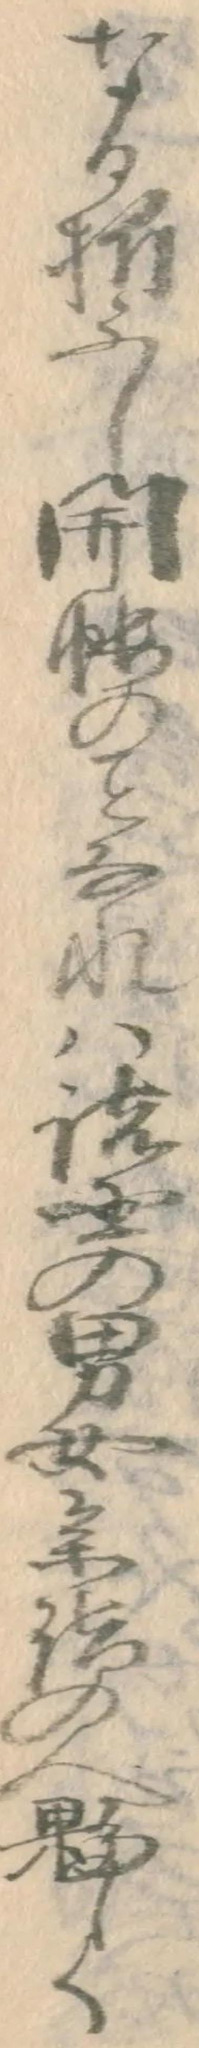なる折ふし開帳のことなれハ諸国の男女参詣の人夥しく

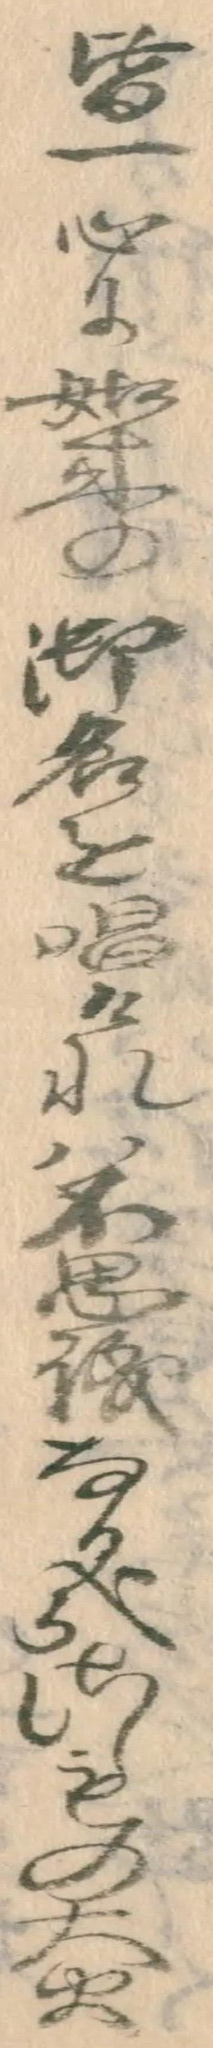皆一心に如来の御名を唱けれハ不思議なる哉さしもの大火
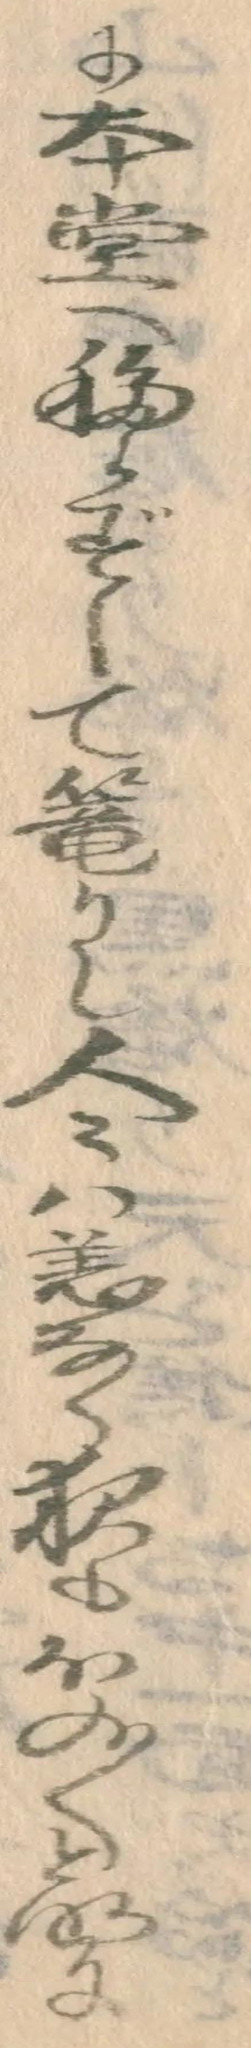に本堂へ移るぞして篭りし人々ハ恙なく夜もほの〳〵と明に
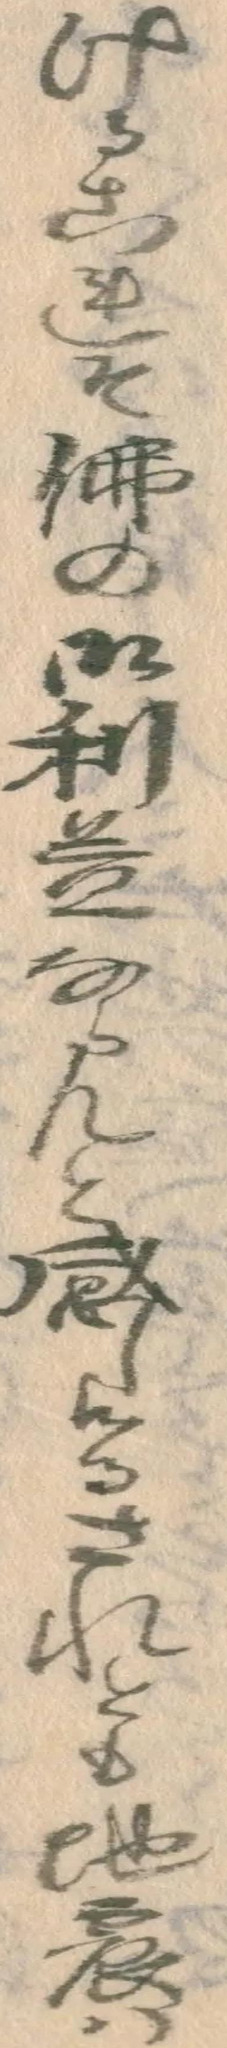けるこれそ仏の御利益ならんと感しけるされとも地震ハ
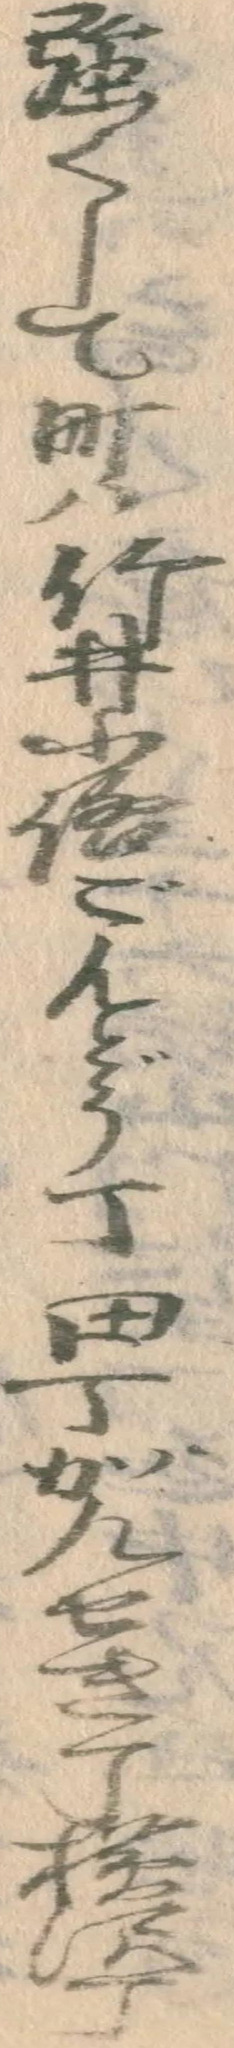強くして町ハ竹井小路ごんどう丁田丁がんせき丁横沢丁
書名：信州大地震之記
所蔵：国立国会図書館 National Diet Library, JAPAN
